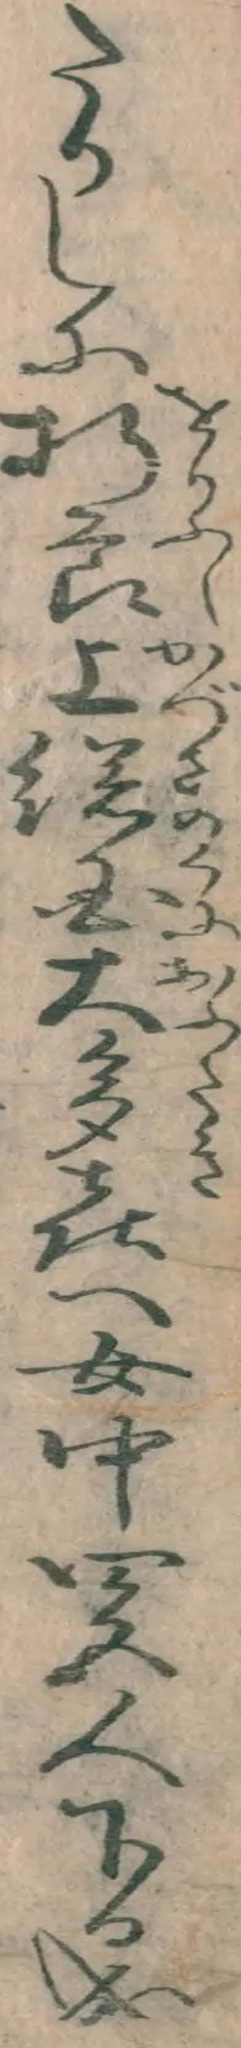たりしに折節上総国大多喜へ女中四五人下る成
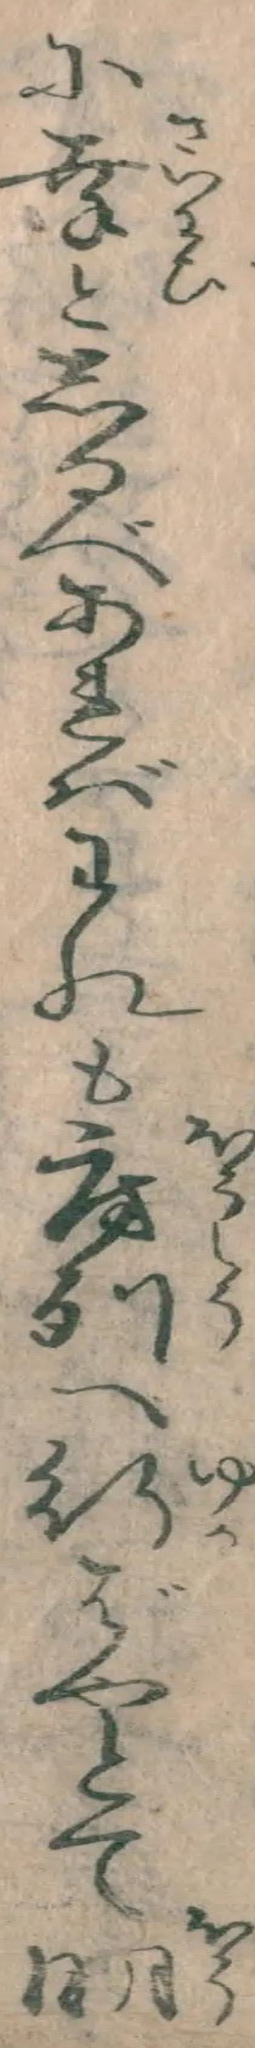に幸としるべあればわれも房州へ行ばやとて朋
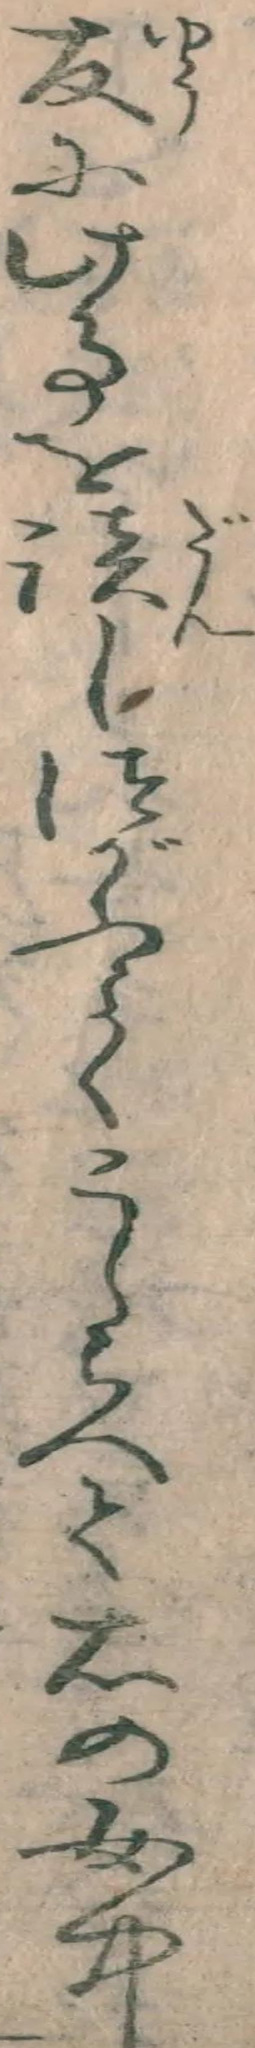友に此事を談しつがふよくこしらへて右の女中
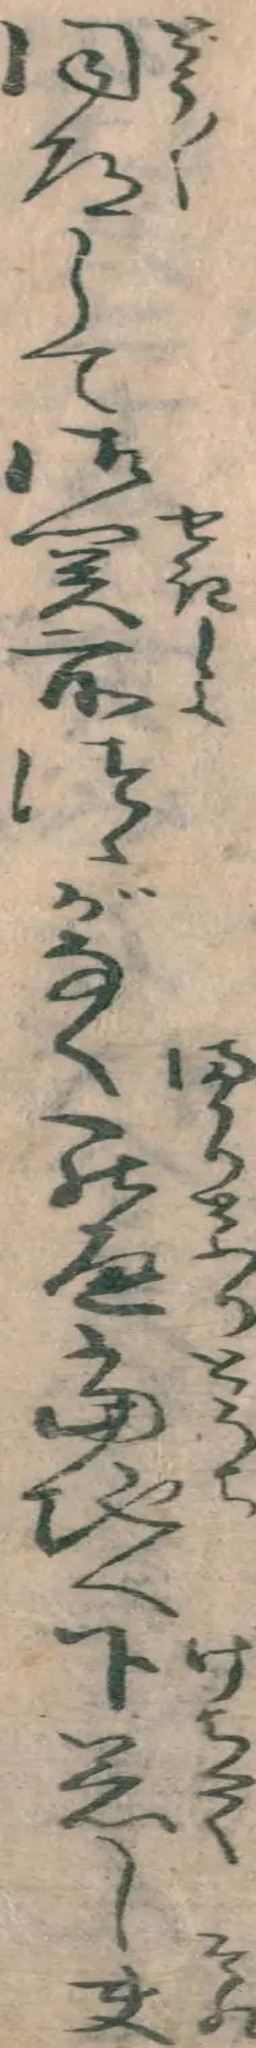同道して御関所つゝがなく罷通当地へ下着し夫
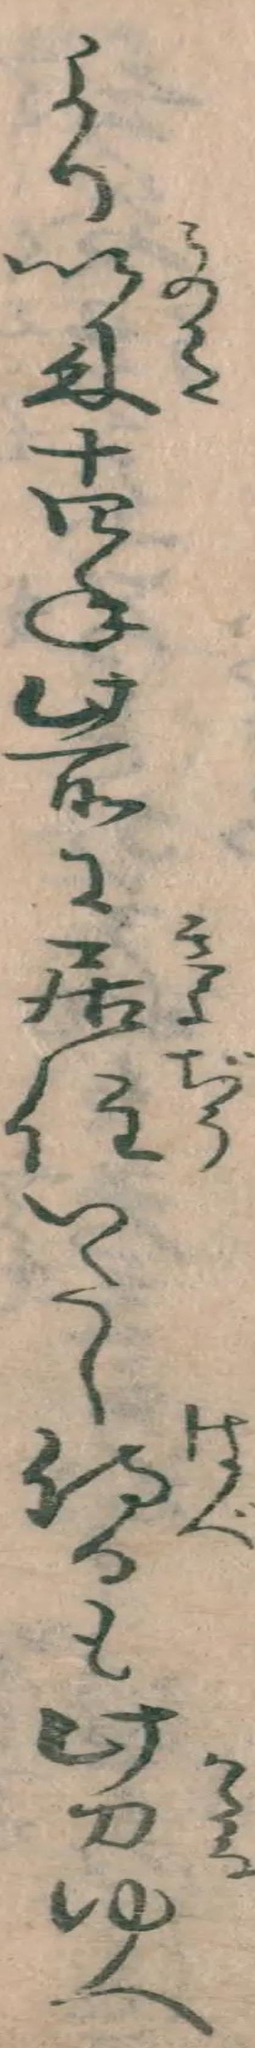より以来十四年此所に居住いたし侍るも此刀ゆへ
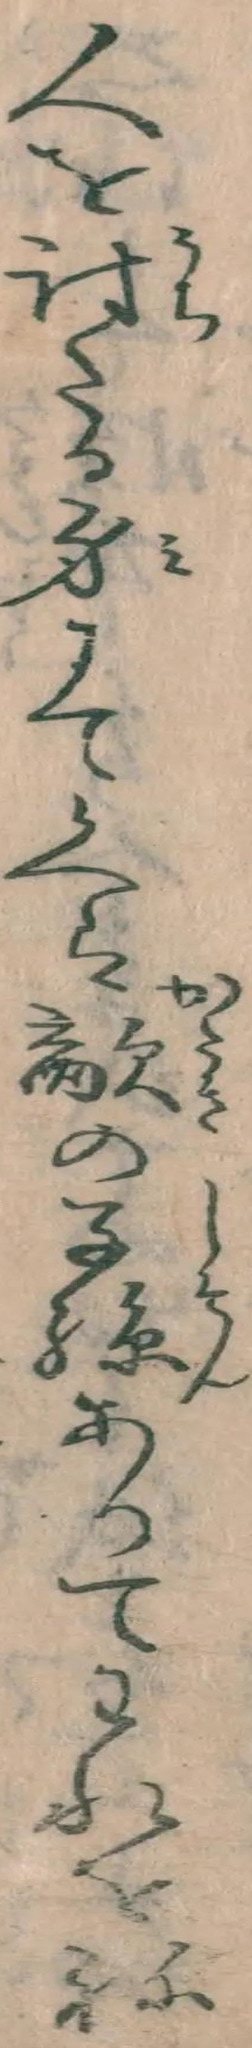人を討たる身にて候へは敵の子孫ありてわれをね
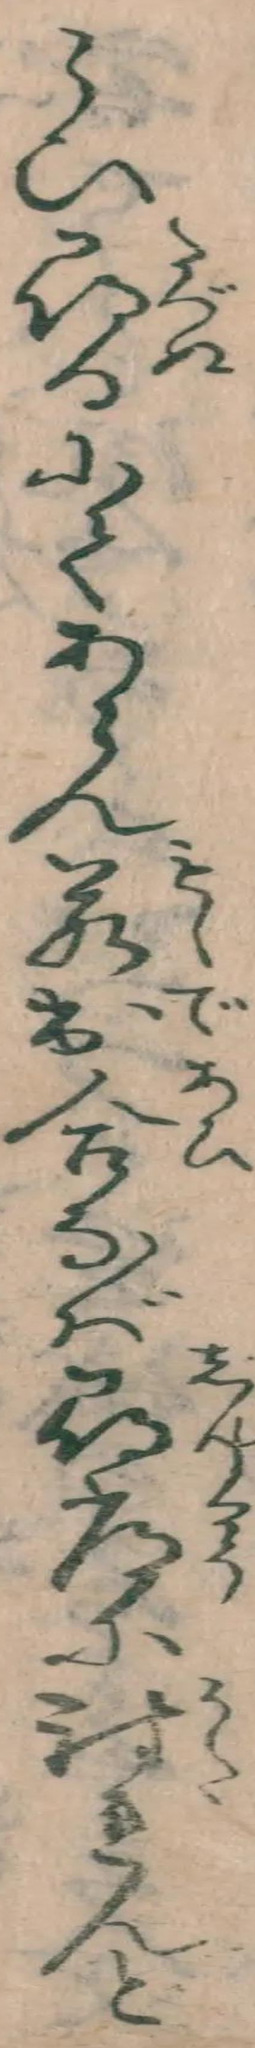らひ尋るにてあらん若出合なば尋常に討れんと
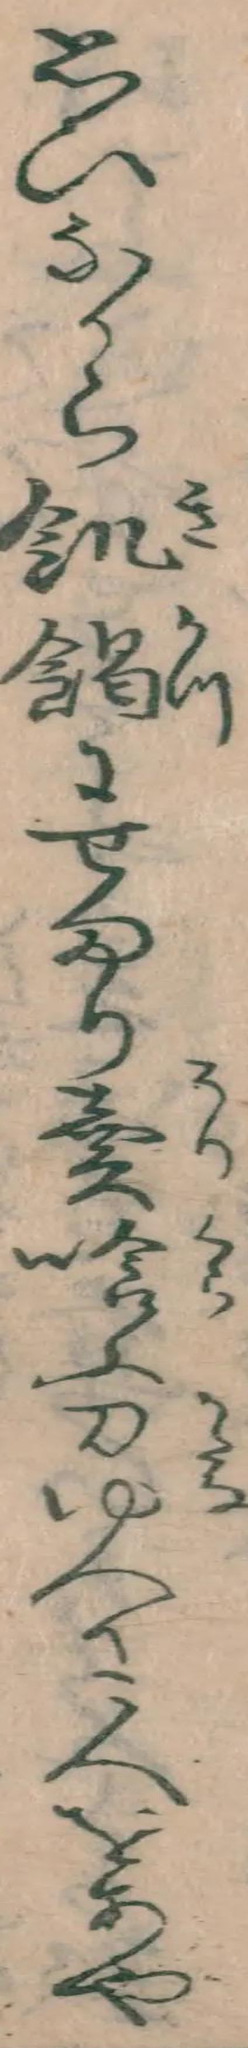思ひなから飢餲にせまり売喰ふ刀ゆへに人をあや
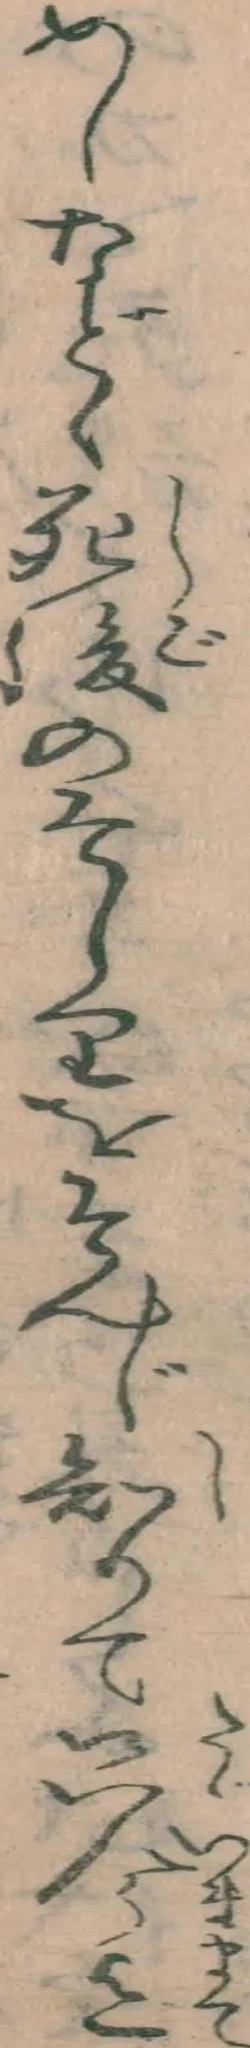めしなどゝ死後のそしりをそんじ知りて只今迄
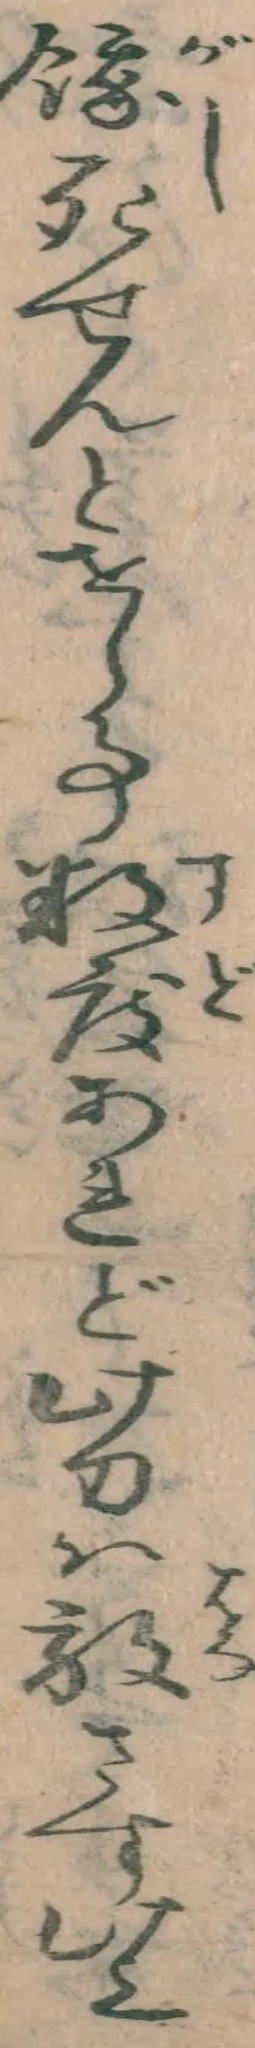餓死せんとせし事数度あれど此刀は放さす此上
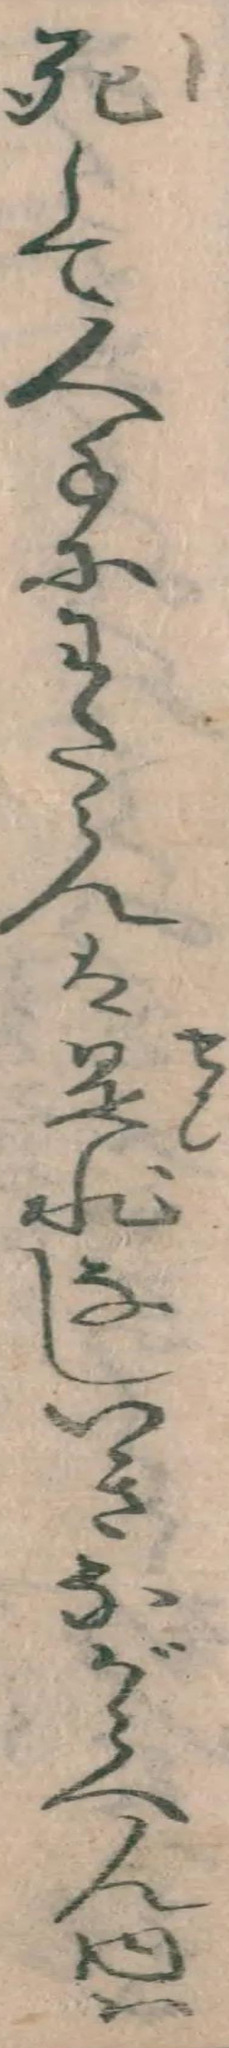死して人手にわたらんは是非なしいきながらへん内は
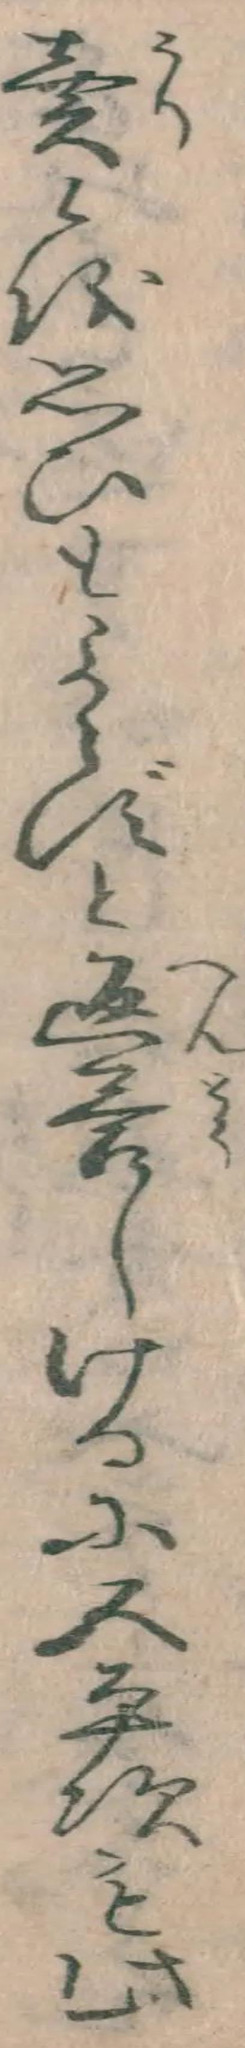売候儀思ひもよらずと返答しけるに五平次も此
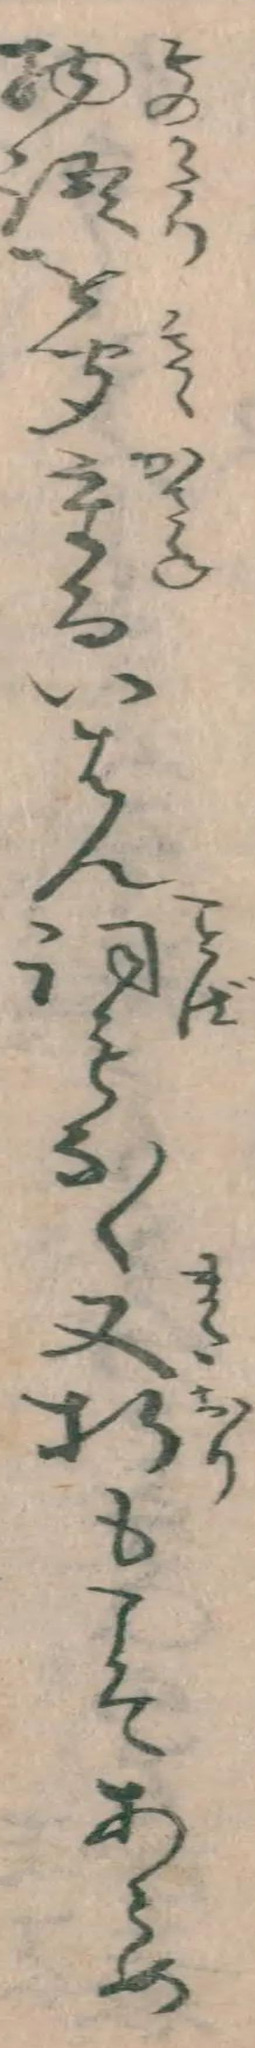物語を聞重而いはん詞もなく又折もこそあらめ
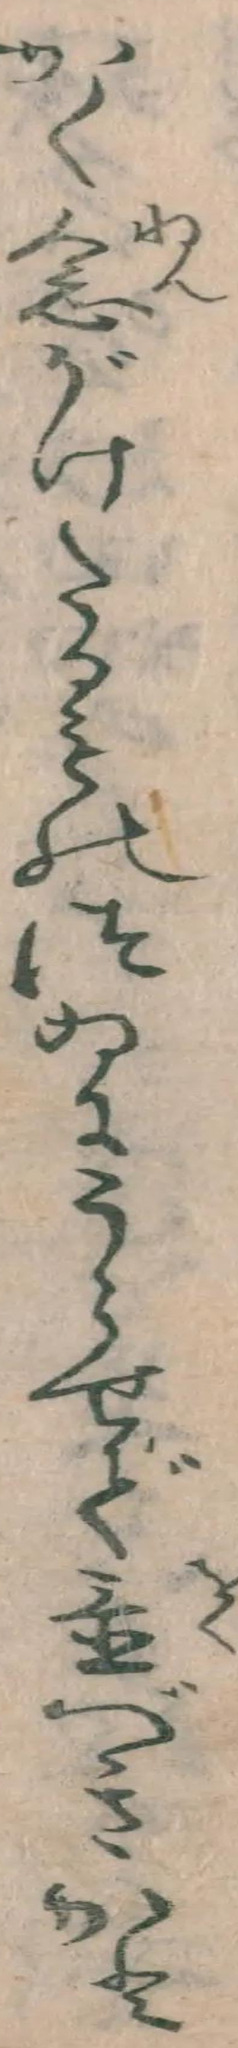かく念がけたるものつゐにうらせで置べきかと
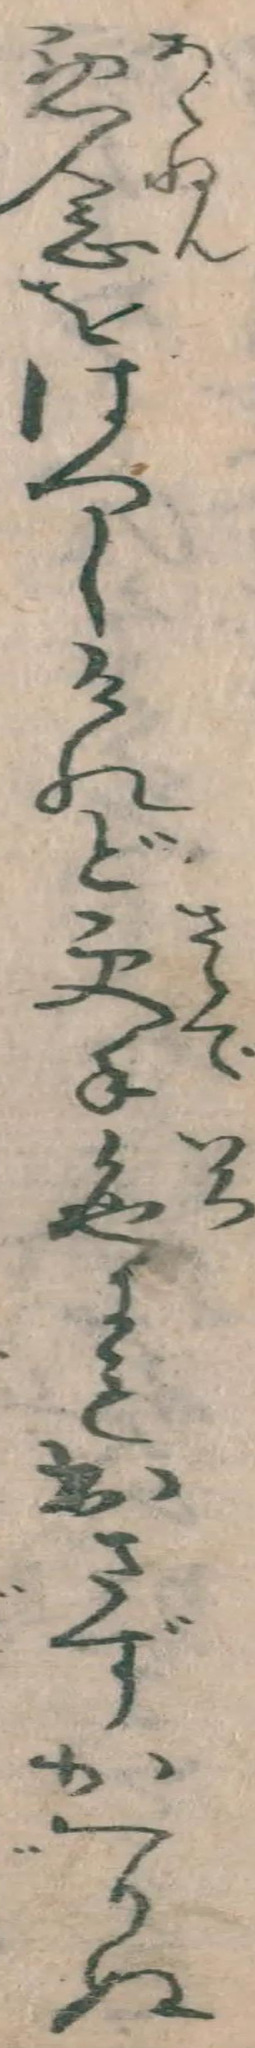悪念をはつしけれど更手色にも出さずかへりぬ
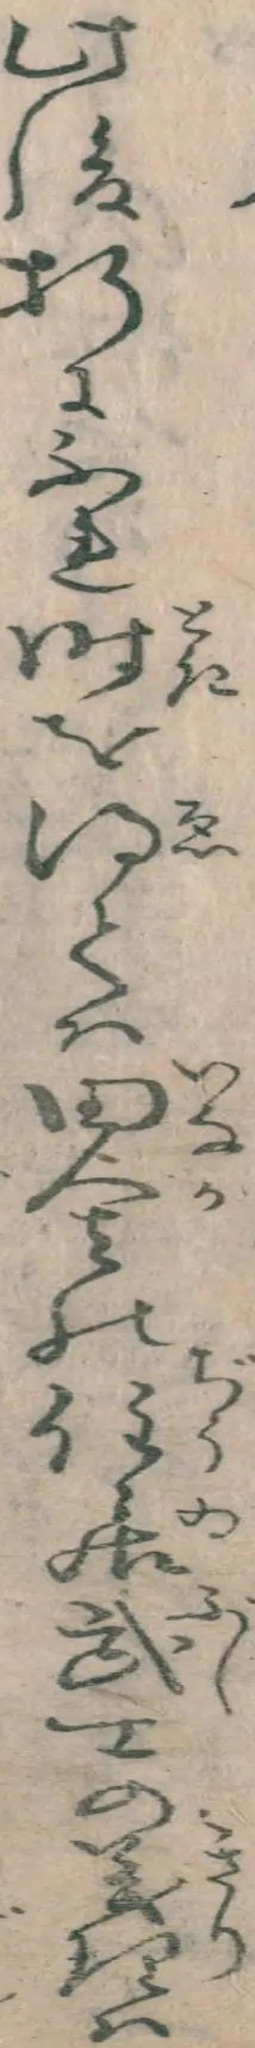此後折にふれ時を得ては田舎の住居武士の義理は
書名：怪談御伽童 5巻. [2]
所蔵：国立国会図書館 National Diet Library, JAPAN
